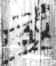城（成）
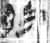於
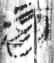晨
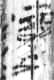○（復）
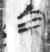於
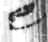巳
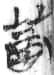○（怨）
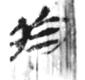於
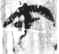午
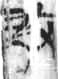○（媚）
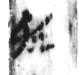於
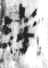未
